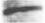一
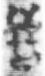晉
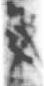杸
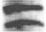二
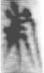旆
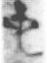屯
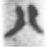八
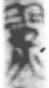翼
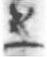之
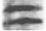二
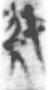○（紛）
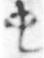屯
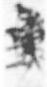○（纁）
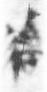○（組）
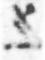之
